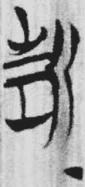折（製）
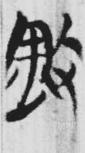敘（除）
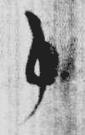十
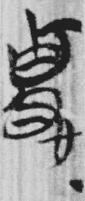惋（怨）
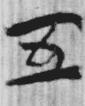五
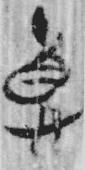德
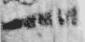一
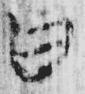曰
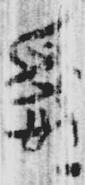○（緩）
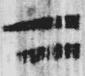二
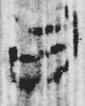曰
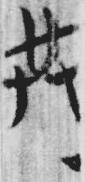共（恭）
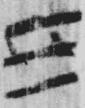三
